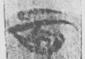百
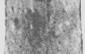卅
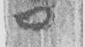四
